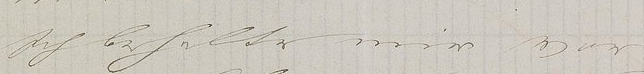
Ich behalte mir vor
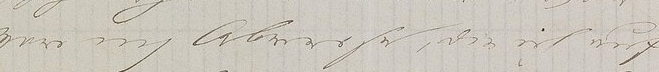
vor m. Abreise, die ich auf
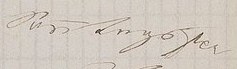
Sonntags per
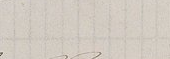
was ich weiter
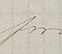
höre.
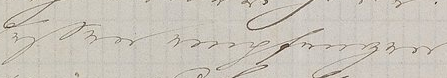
Indessen empfangen
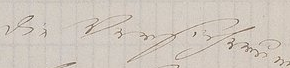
die Versicherung
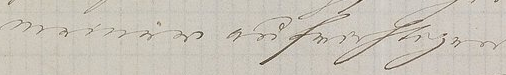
meiner aufrichtigen
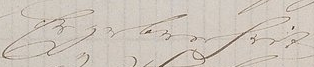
Ergebenheit.
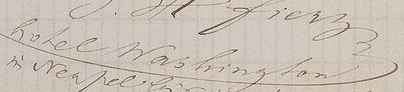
hotel Washington
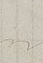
in
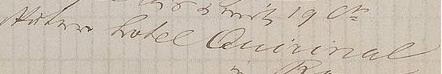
später hotel Quirinal
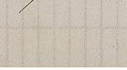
Escher
